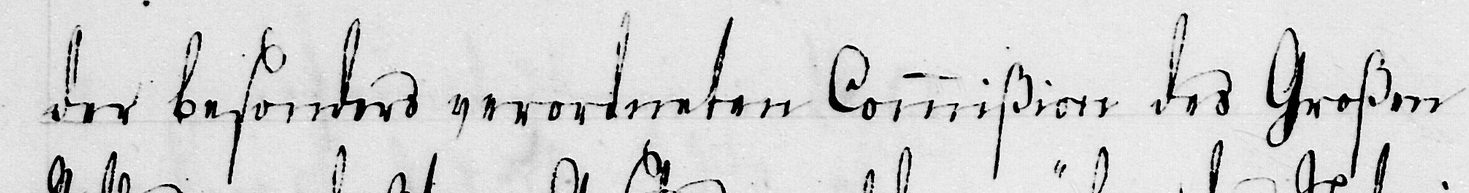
der besonders verordneten Commißion des Großen
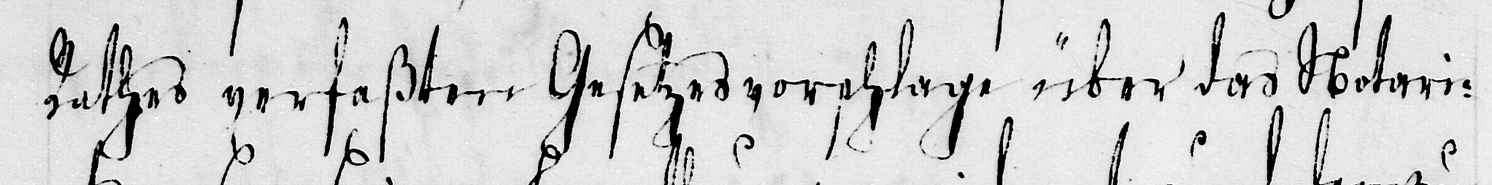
Rathes verfaßten Gesetzesvorschlage über das Notari¬
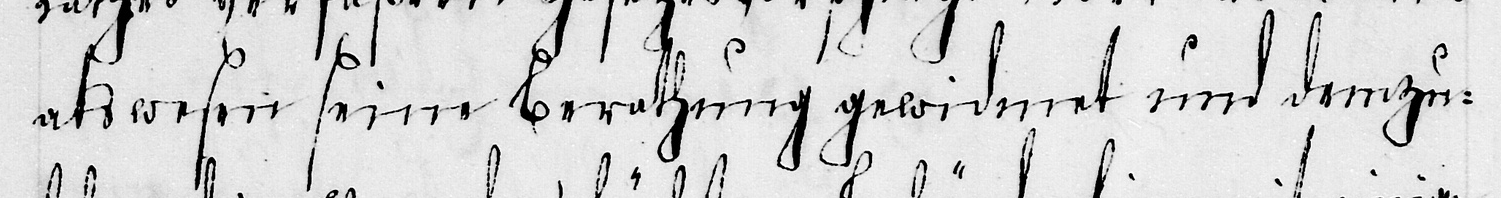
atswesen seine Berathung gewidmet und demzu¬
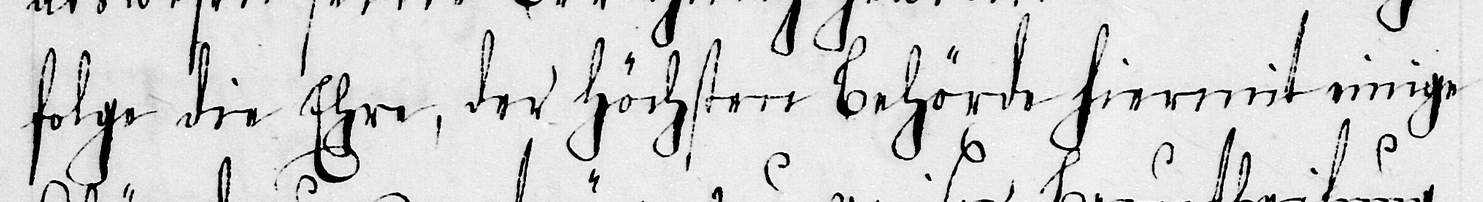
folge die Ehre, der Höchsten Behörde hiermit einige
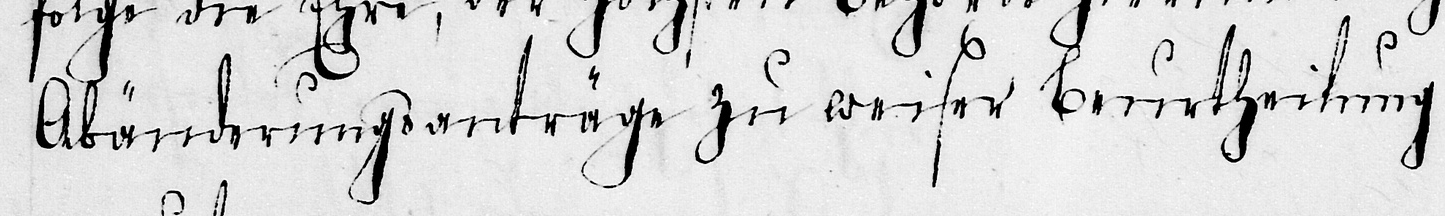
Abänderungsanträge zu weiser Beurtheilung
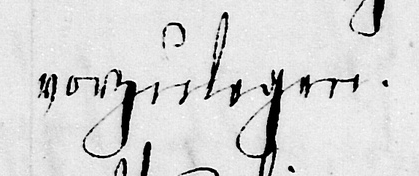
vorzulegen.
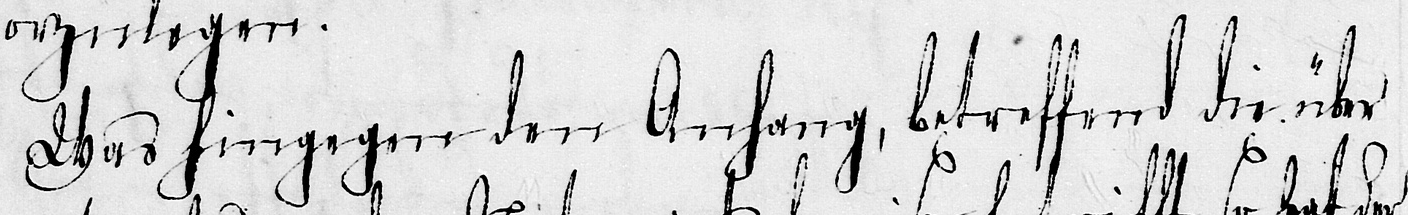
Was hingegen den Anhang, betreffend die über
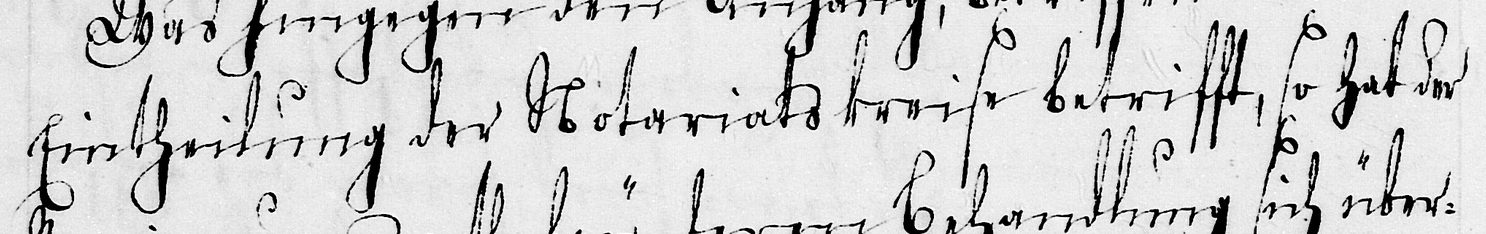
Eintheilung der Notariatskreise betrifft, so hat der
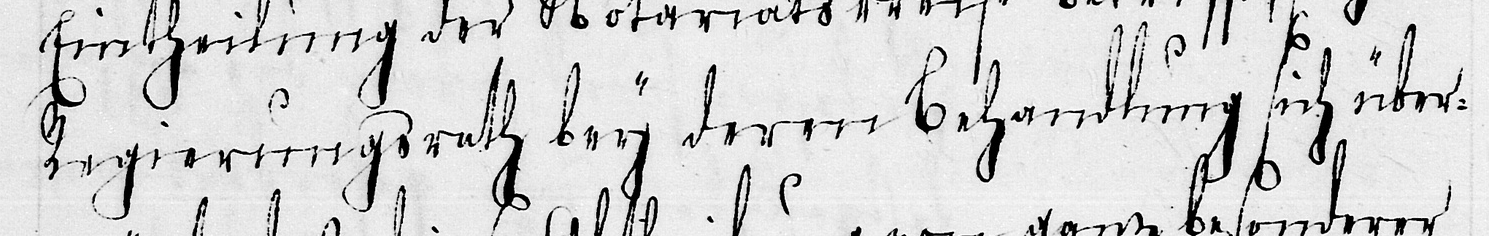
Regierungsrath bey deren Behandlung sich über¬
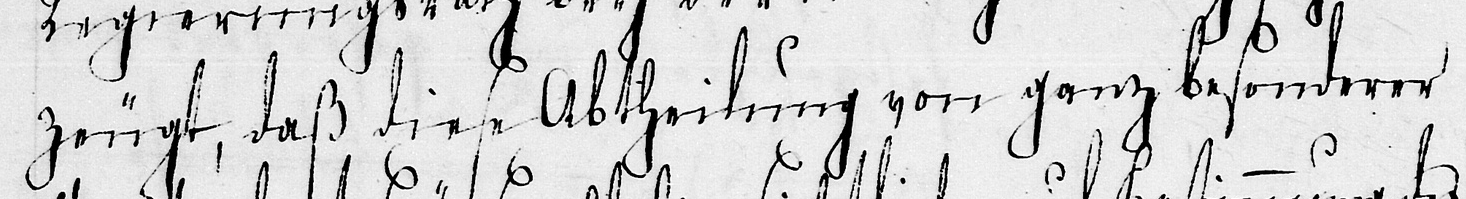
zeugt, daß diese Abtheilung von ganz besonderer
